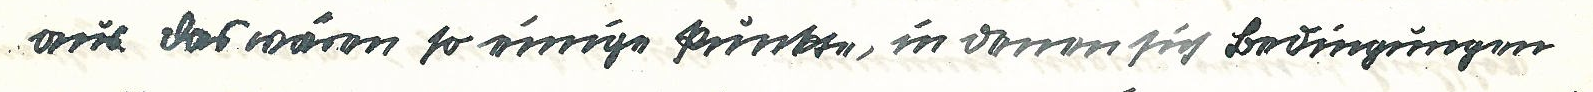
aus. Das wären so einige Punkte, in denen sich Bedingungen
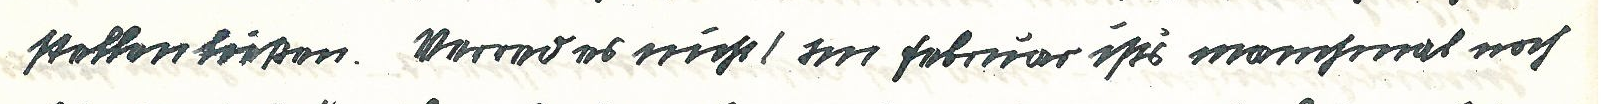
stellen ließen. Verred es nicht! Im Februar ist’s manchmal noch
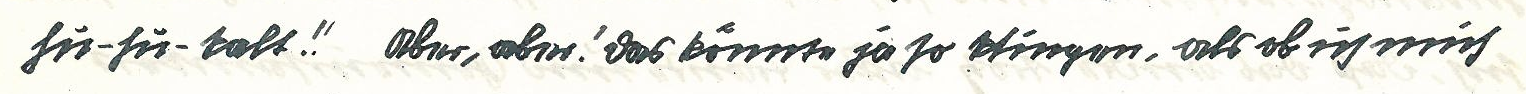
hu–hu-kalt!! Aber, aber! Das könnte ja so klingen, als ob ich mich
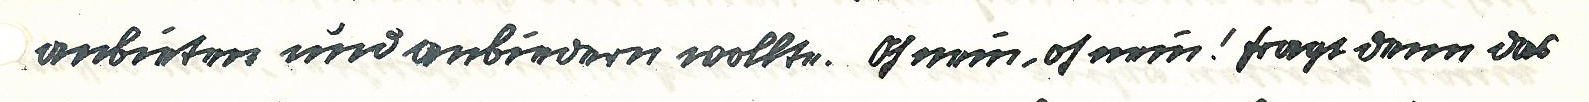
anbieten oder anbiedern wollte. Oh nein, oh nein! Fragt denn das
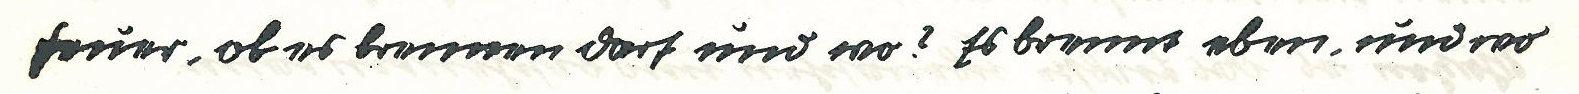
Feuer, ob es brennen darf und wo? Es brennt eben, und wo
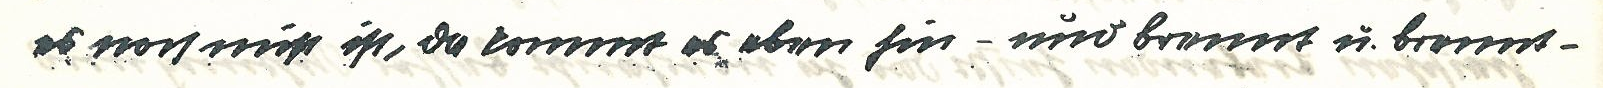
es noch nicht ist, da kommt es eben hin – und brennt u. brennt –
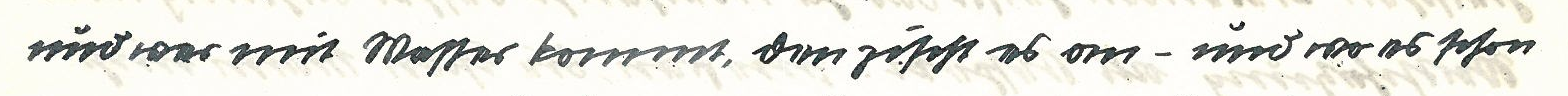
und wer mit Wasser kommt, den zischt es an – und wo es schon
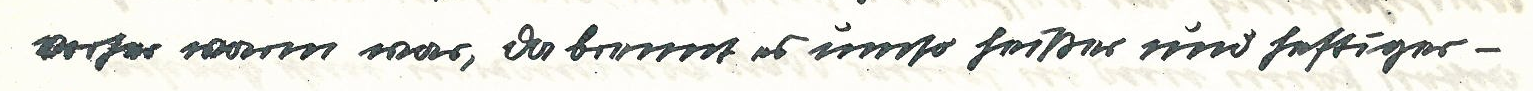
vorher warm war, da brennt es umso heißer und heftiger –
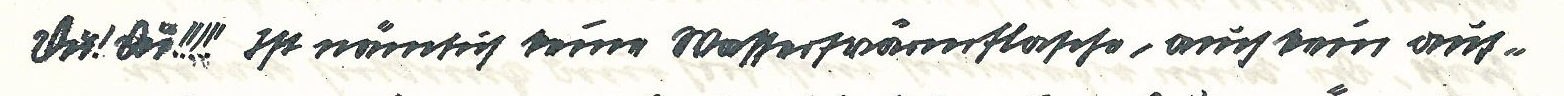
Du! Du!!!!! Ist nämlich keine Wasserwärmflache, auch kein auf¬
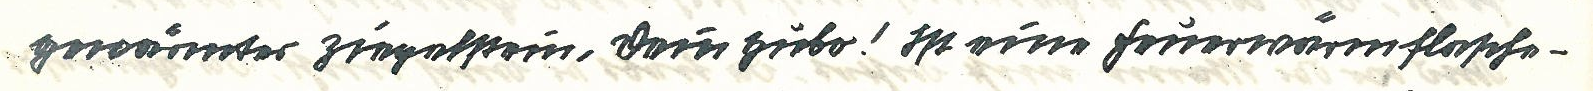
gewärmter Ziegelstein, Dein Hubo! Ist eine Feuerwärmflasche –
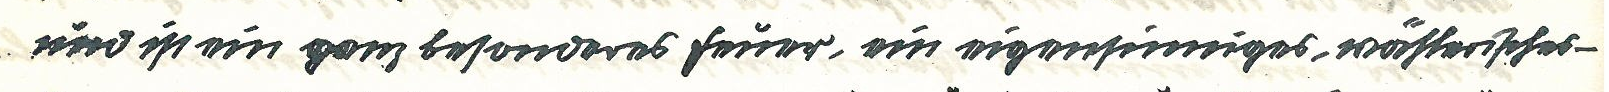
und ist ein ganz besonderes Feuer, ein eigensinniges, wählerisches –
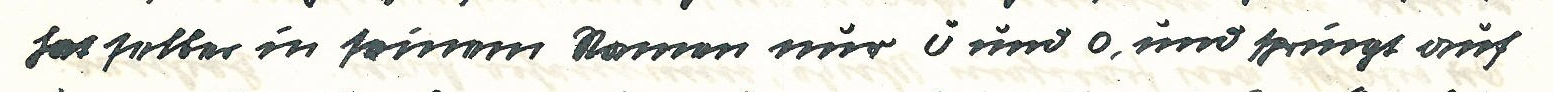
hat selber in seinem Namen nur u und o, und springt auf
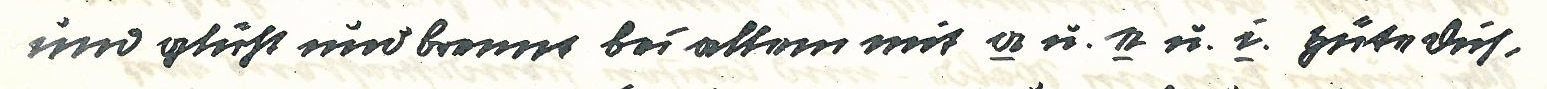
und glüht und brennt bei allem mit a u. e u. i. Hüte Dich,
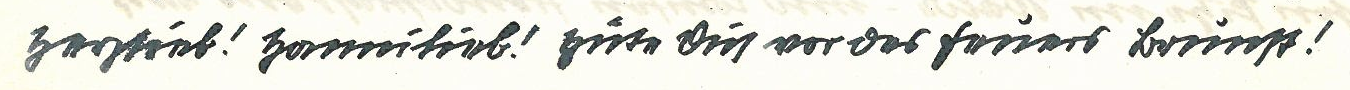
Herzlieb! lieb! Hüte Dich vor des Feuers Brunst!
